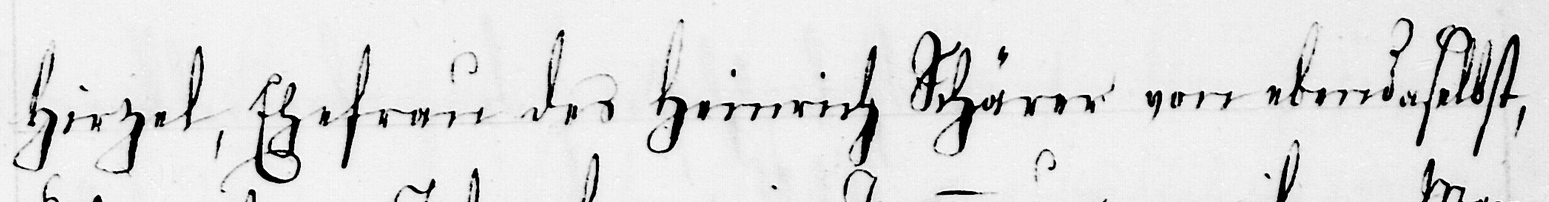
Hirzel, Ehefrau des Heinrich Schärer von ebendaselbst,
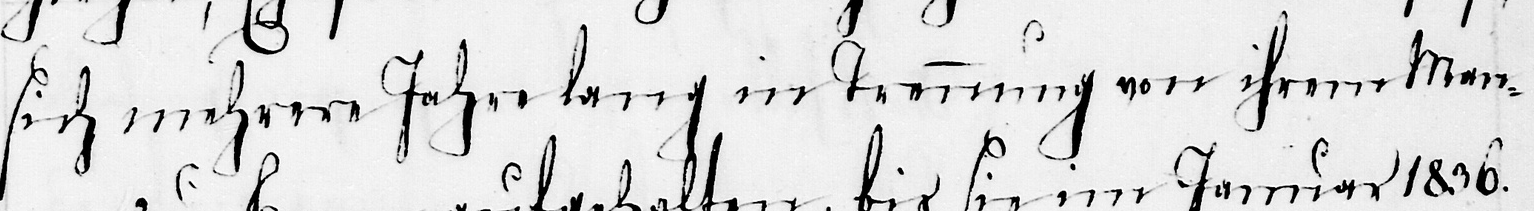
sich mehrere Jahre lang in Trennung von ihrem Man¬
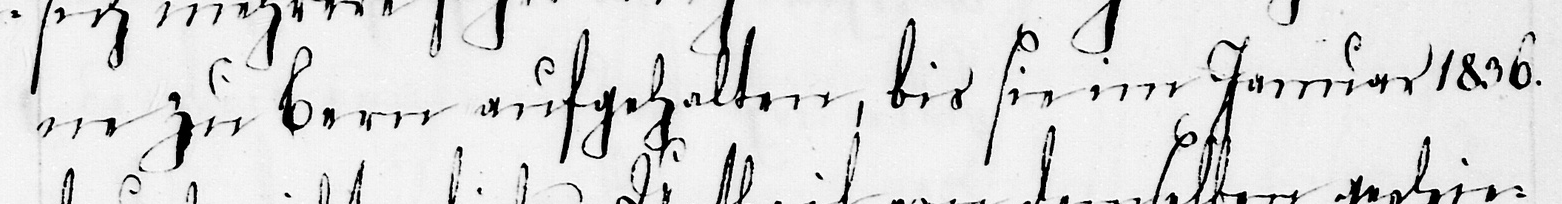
ne zu Bern aufgehalten, bis sie im Januar 1836.
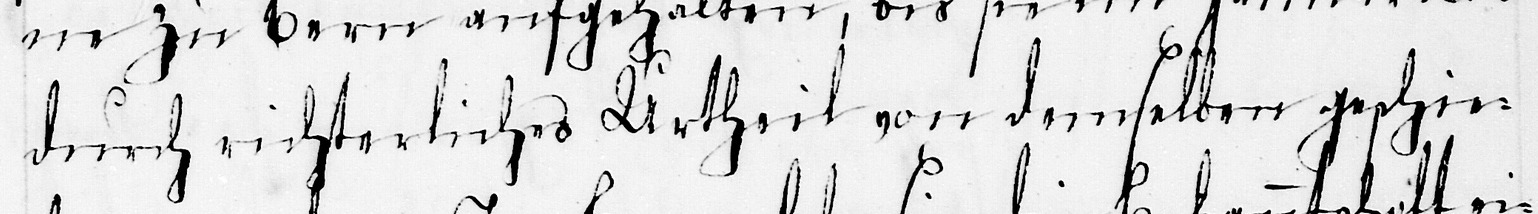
durch richterliches Urtheil von demselben geschie¬
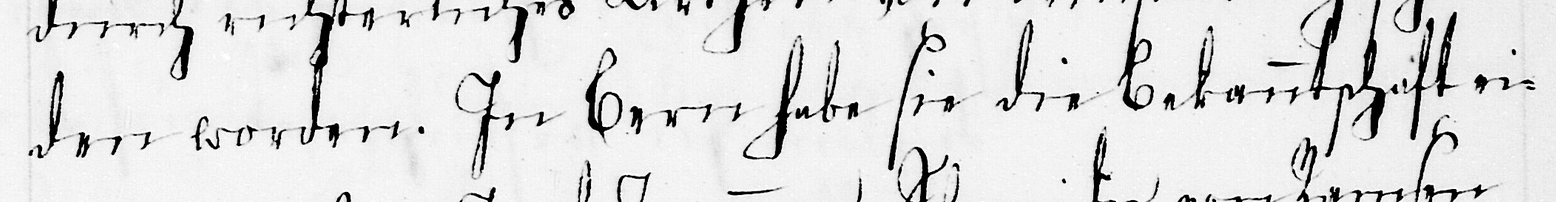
den worden. In Bern habe sie die Bekanntschaft ei¬
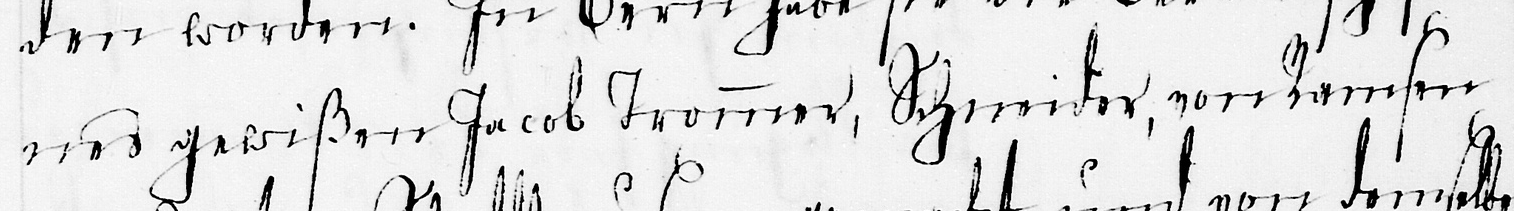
nes gewißen Jacob Trommer, Schneider, von Ramsen
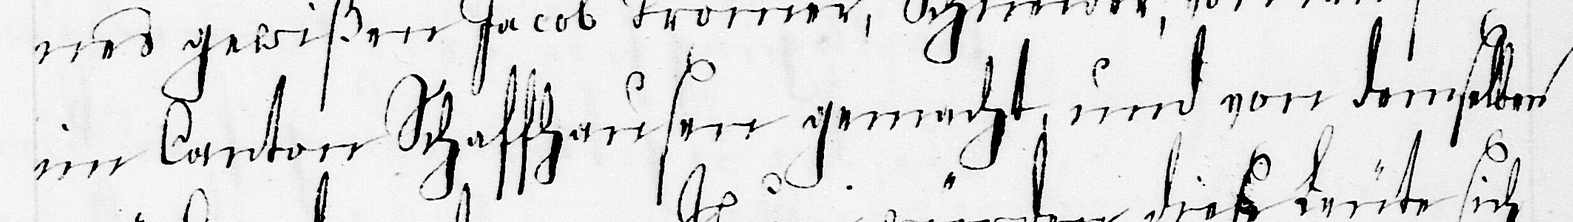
im Canton Schaffhausen gemacht, und von demselben
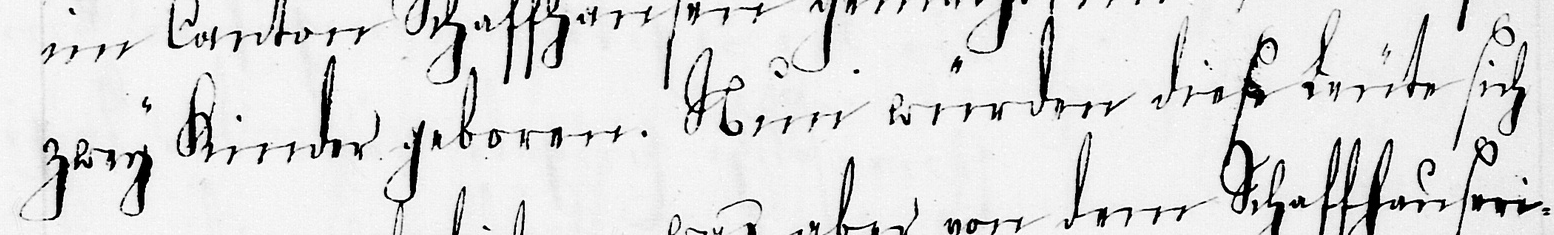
zwey Kinder geboren. Nun würden diese Leute sich
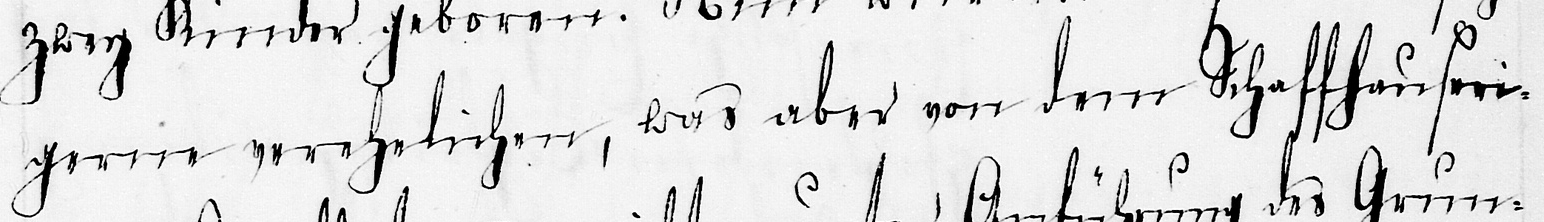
gerne verehelichen, was aber von dem Schaffhauseri¬
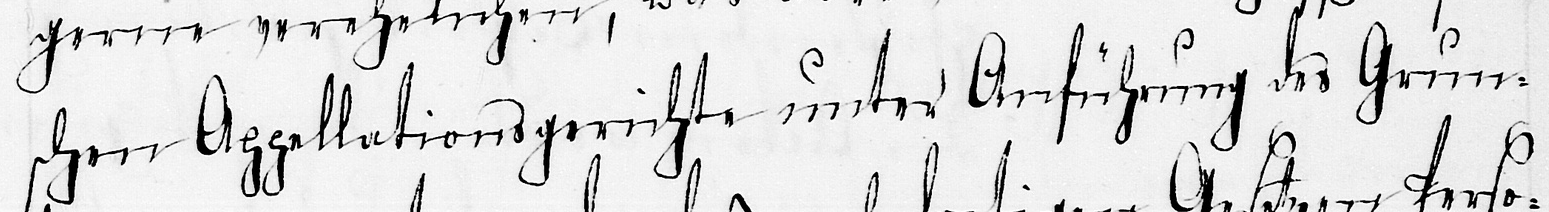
schen Appellationsgerichte unter Anführung des Grun¬
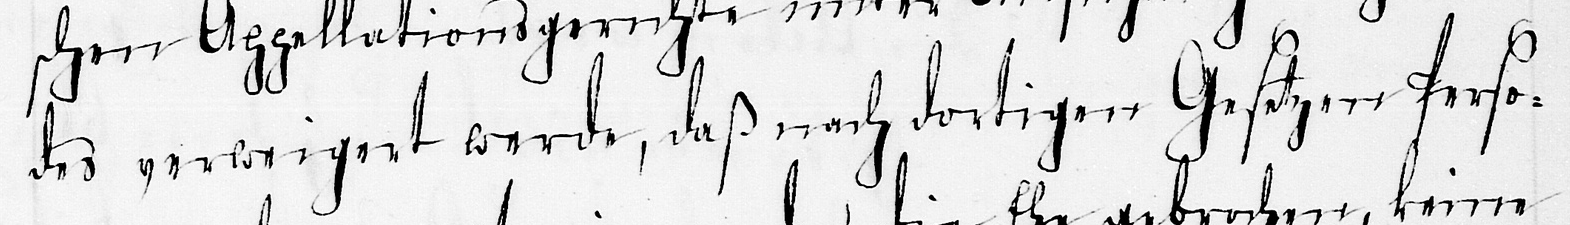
des verweigert werde, daß nach dortigen Gesetzen Perso¬
